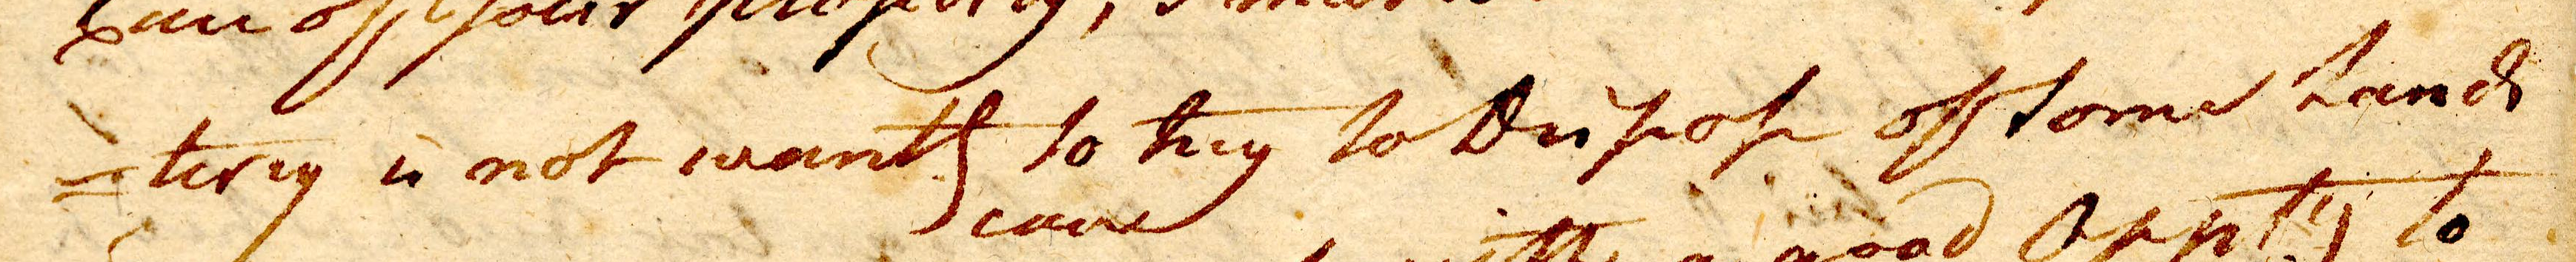-terey is not wants to try to Dispose off some Land
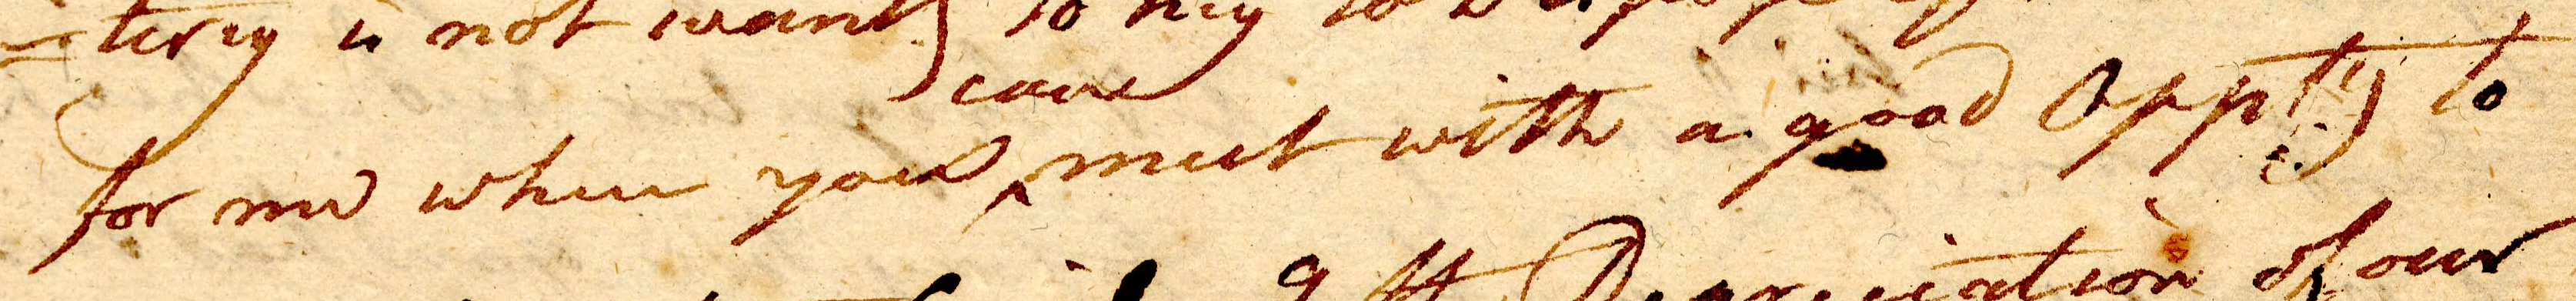for me where you ^ meet with a good Opp^ty. to
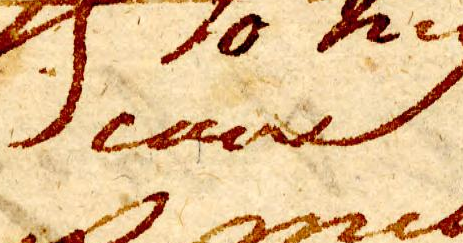can
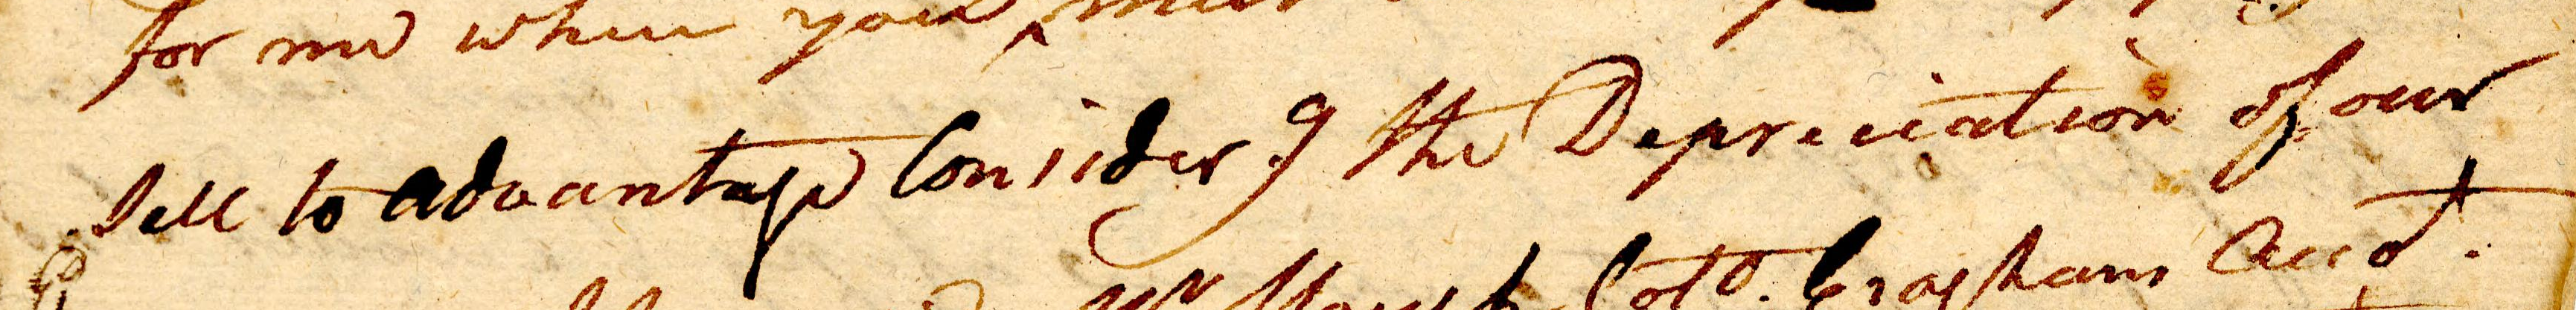sell to advantage Consider^g the Depreciation of our
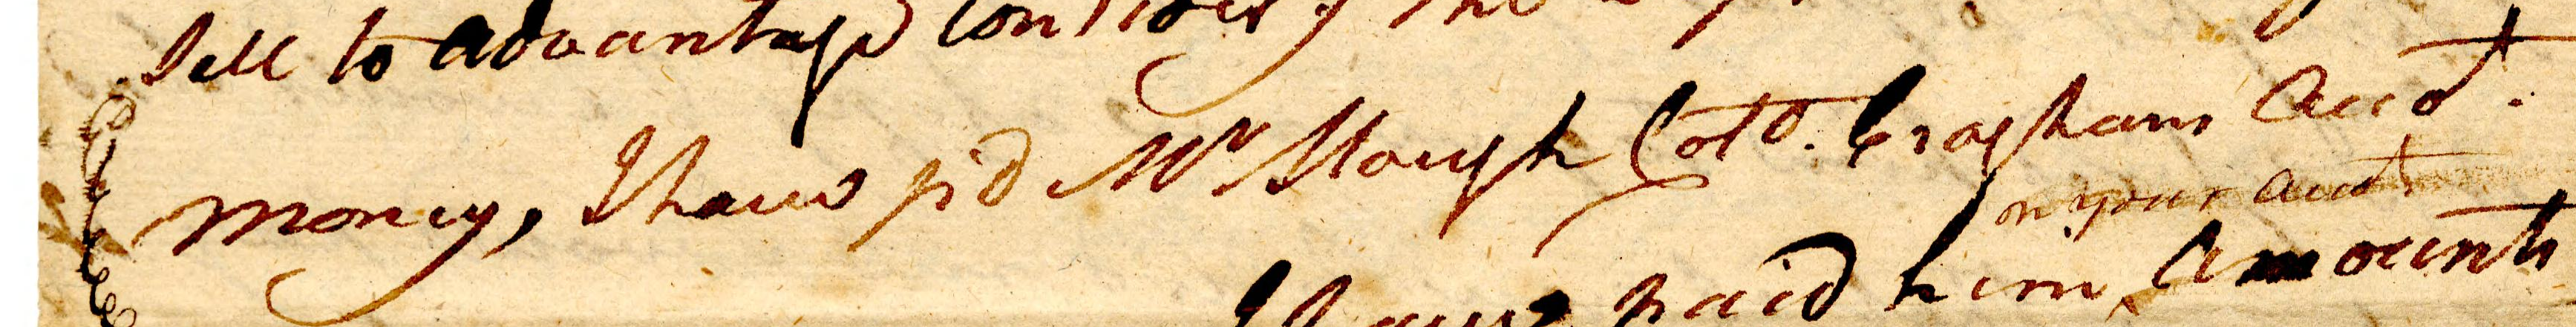money, I have p'd M^r. Mayh Col^o. Croghans Acco^t
